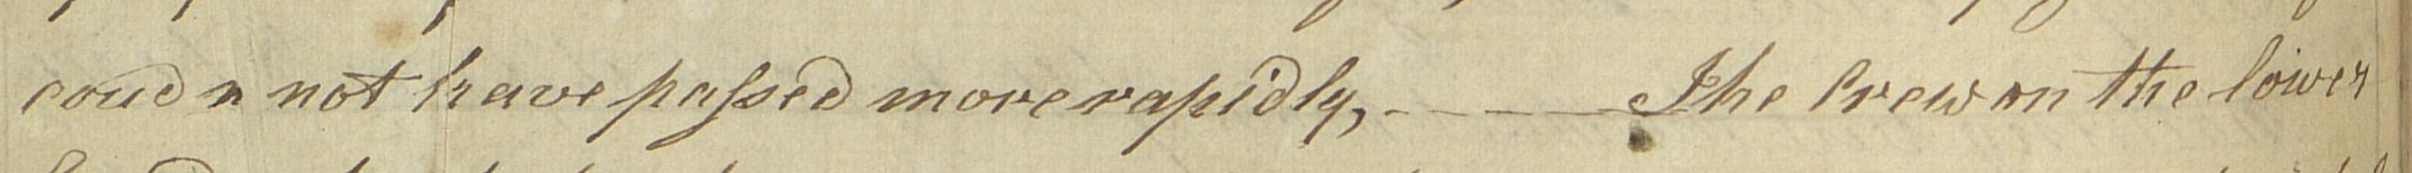coud not have passed more rapidly, The Crew on the lower
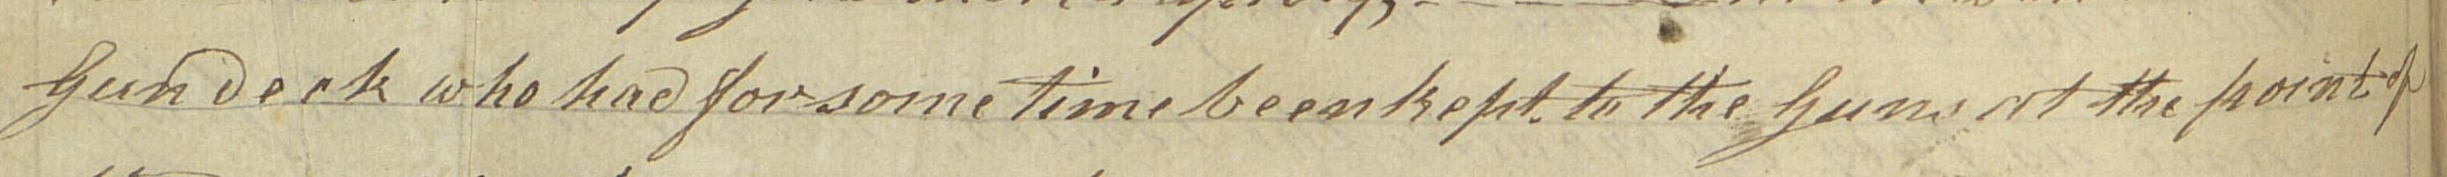Gundeck who had for sometime been kept to the Guns at the point of
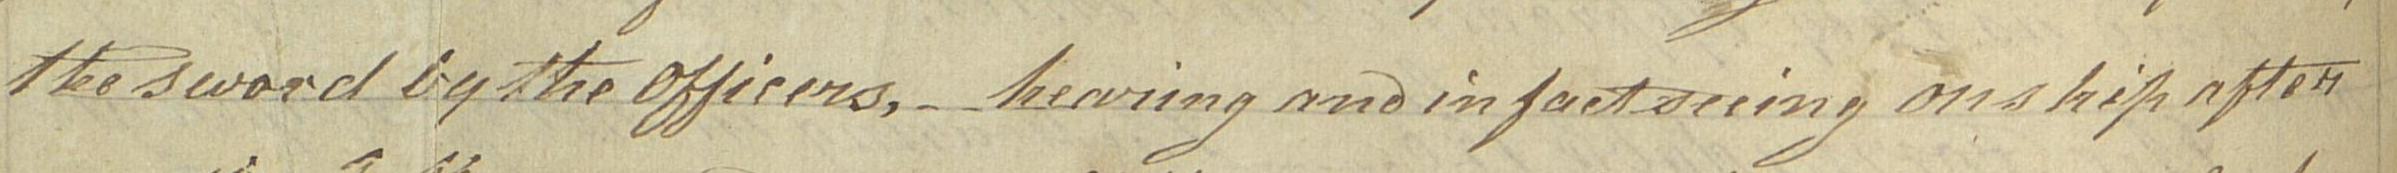the sword by the Officers, hearing and in fact seeing on ship after
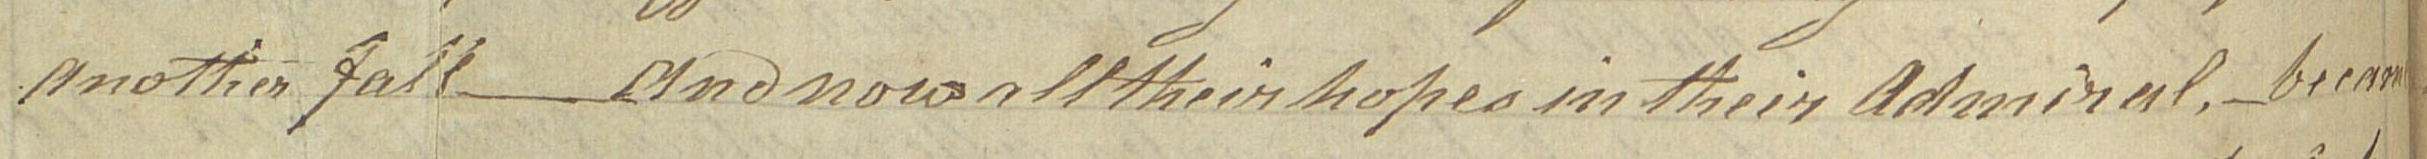another fall And now all their hopes in their Admiral, becam-
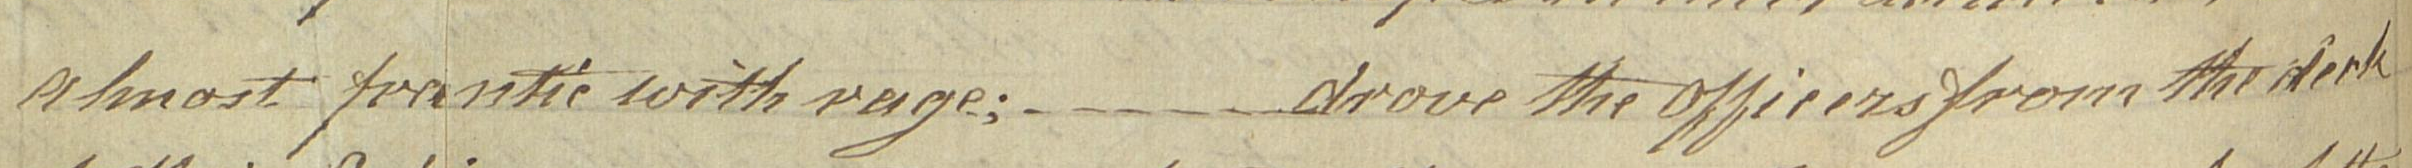almost frantic with rage: drove the officers from the deck
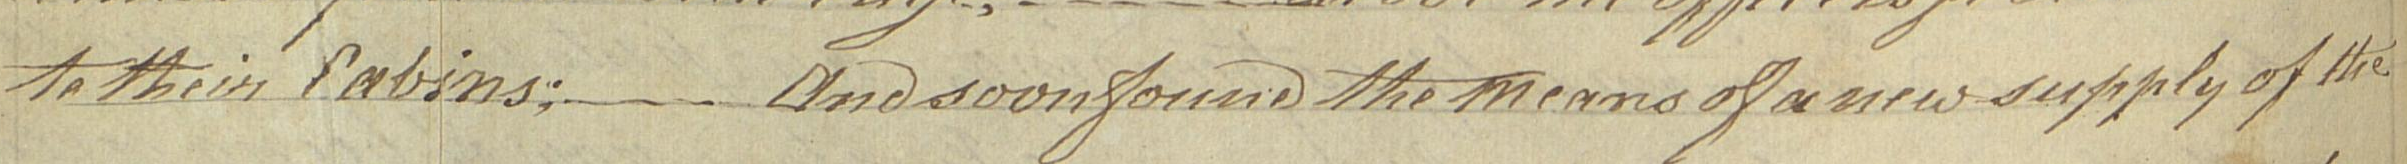to their Cabins: And soon found the means of a new supply of the
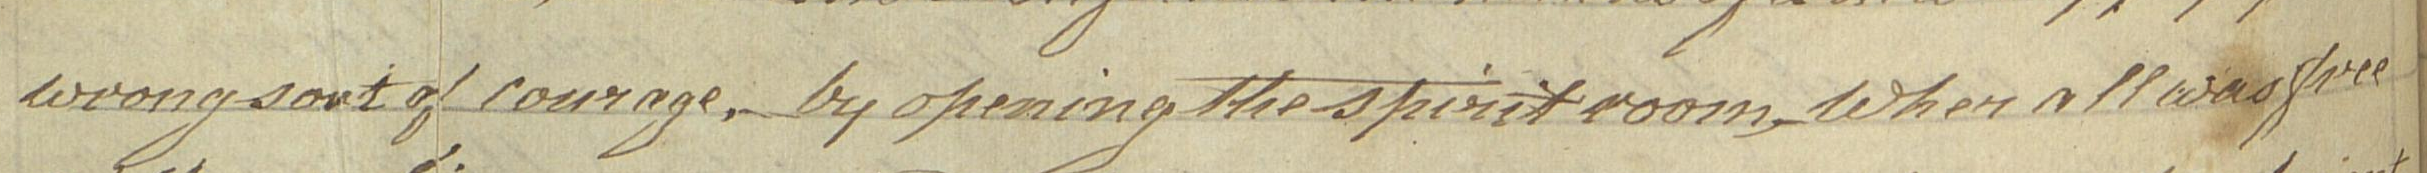wrong sort of Courage, by opening the spirit room, when all was free
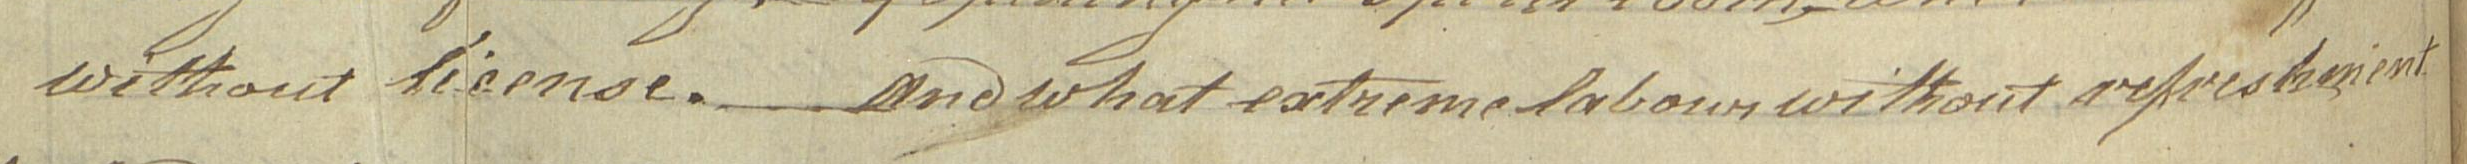without license. and what extreme labour without refreshment
